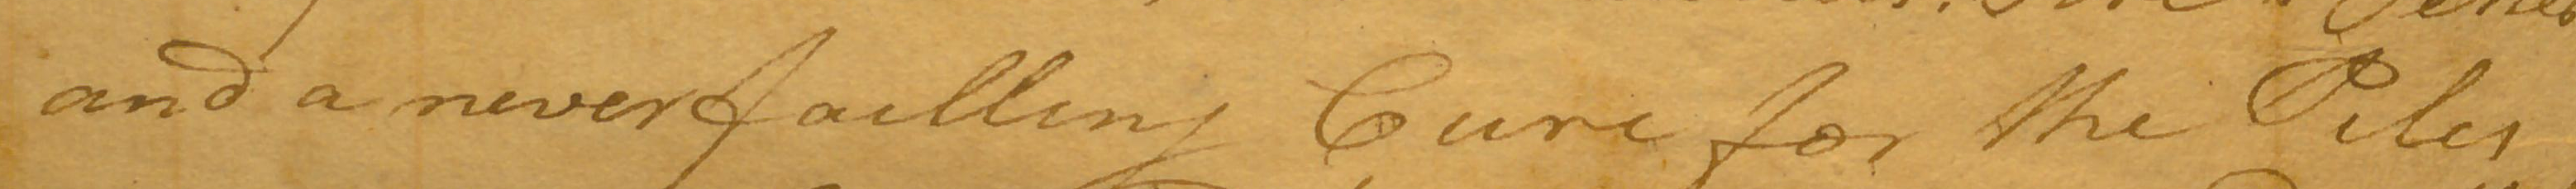and a neverfailling Cure for the Piles
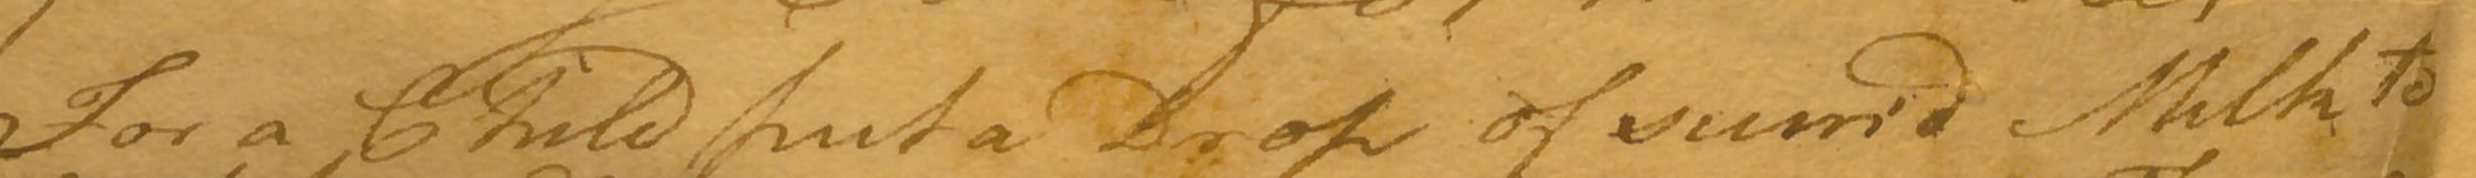For a cChild put a Drop of sum'd Milk to
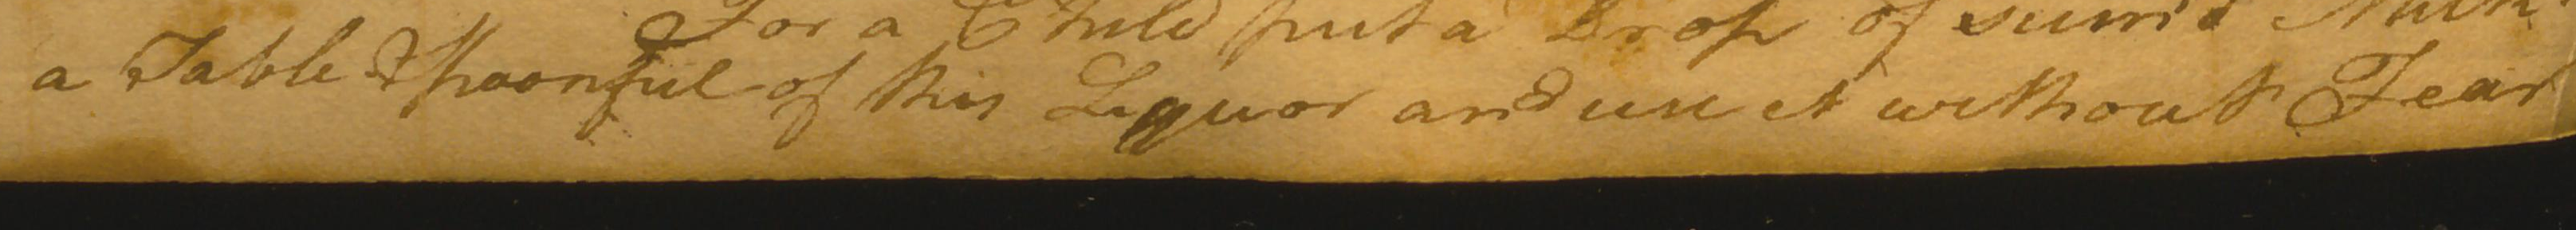a Table Spoonful of his Liquor and use it withotu Fear
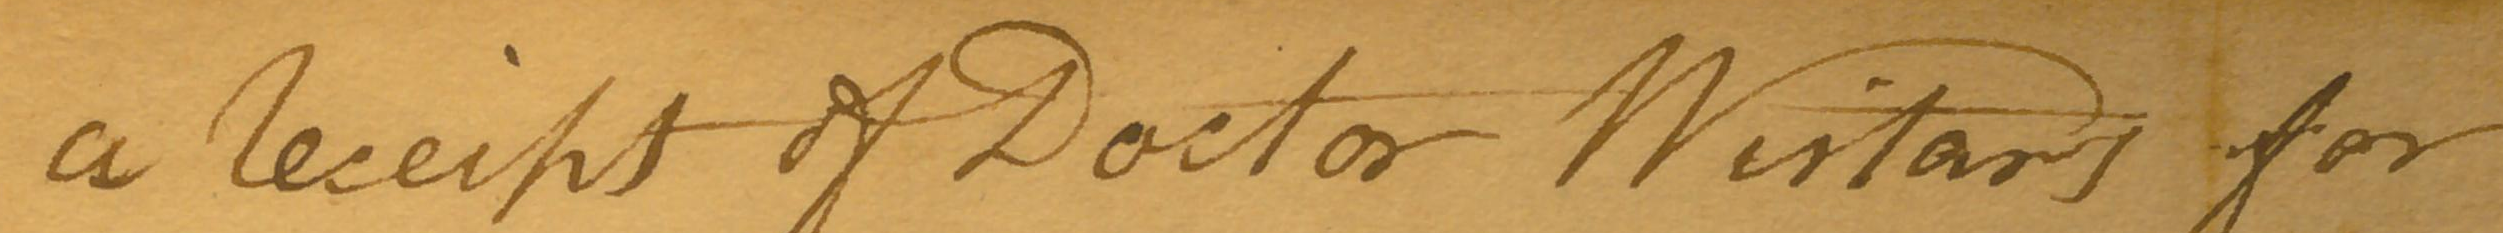a receipt of Doctor Wistars for
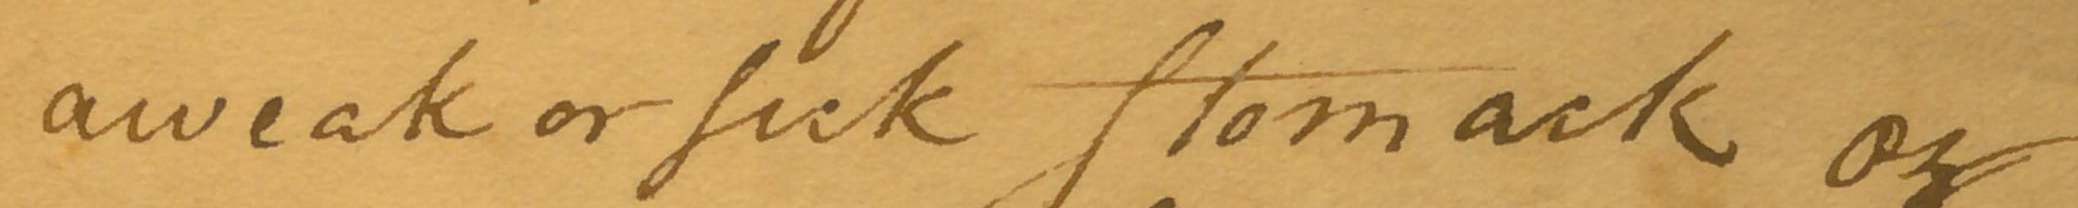a weak or sick stomack oz
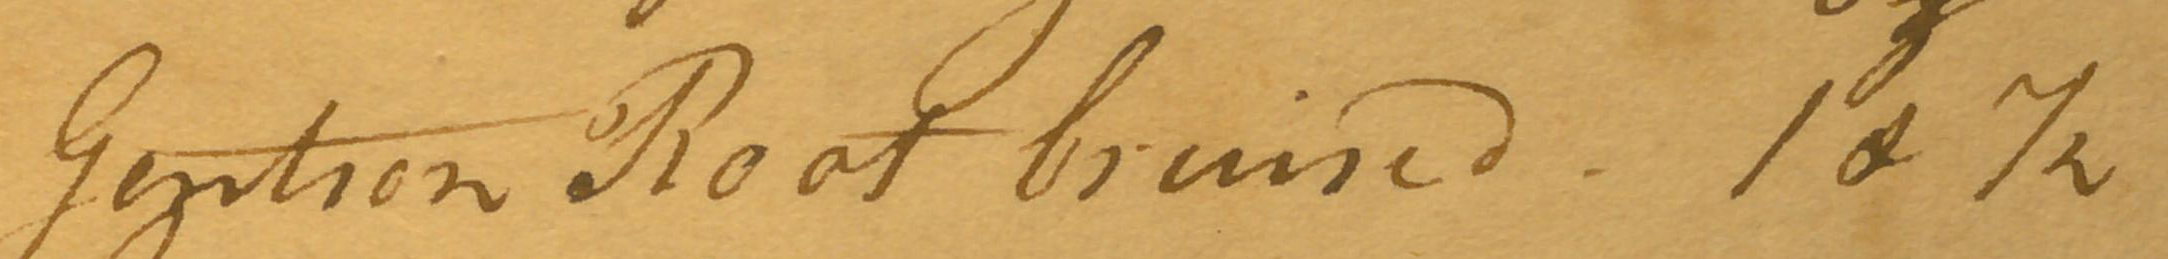Gention Root bruised. 1 & 1/2
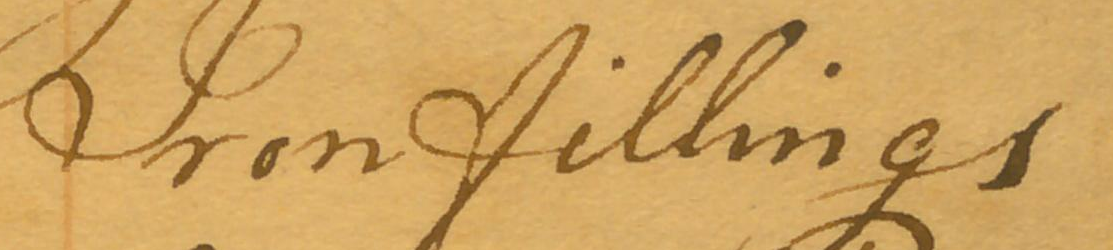Iron fillings
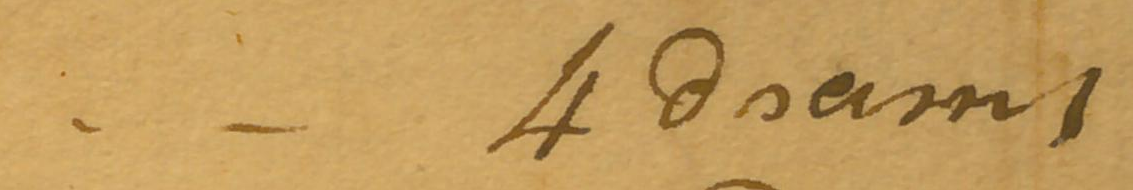-- 4 drams
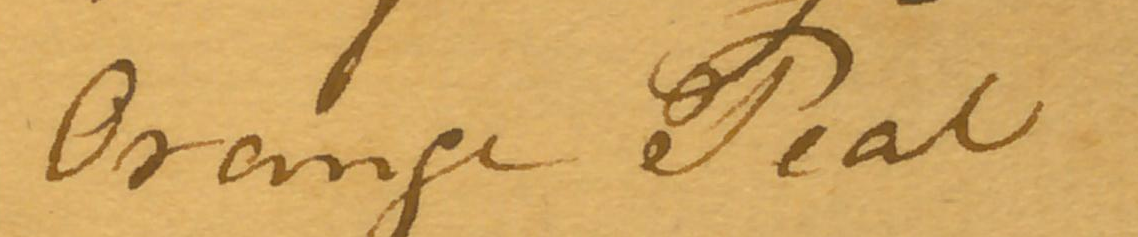Orange Peal
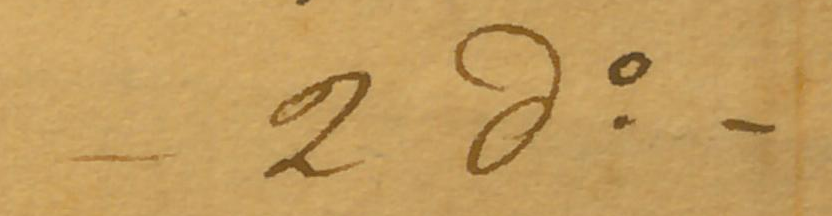- 2 d^o.-
